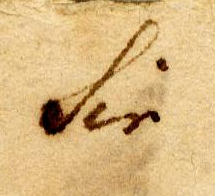Sir
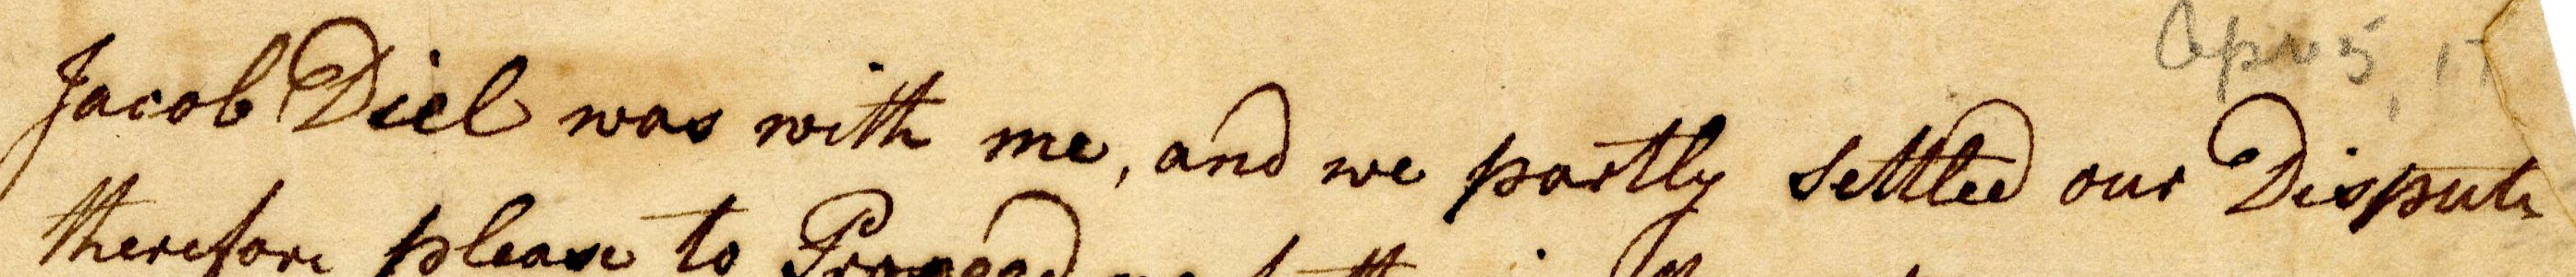Jacob Diel was with me, and we partly Settled our Dispute
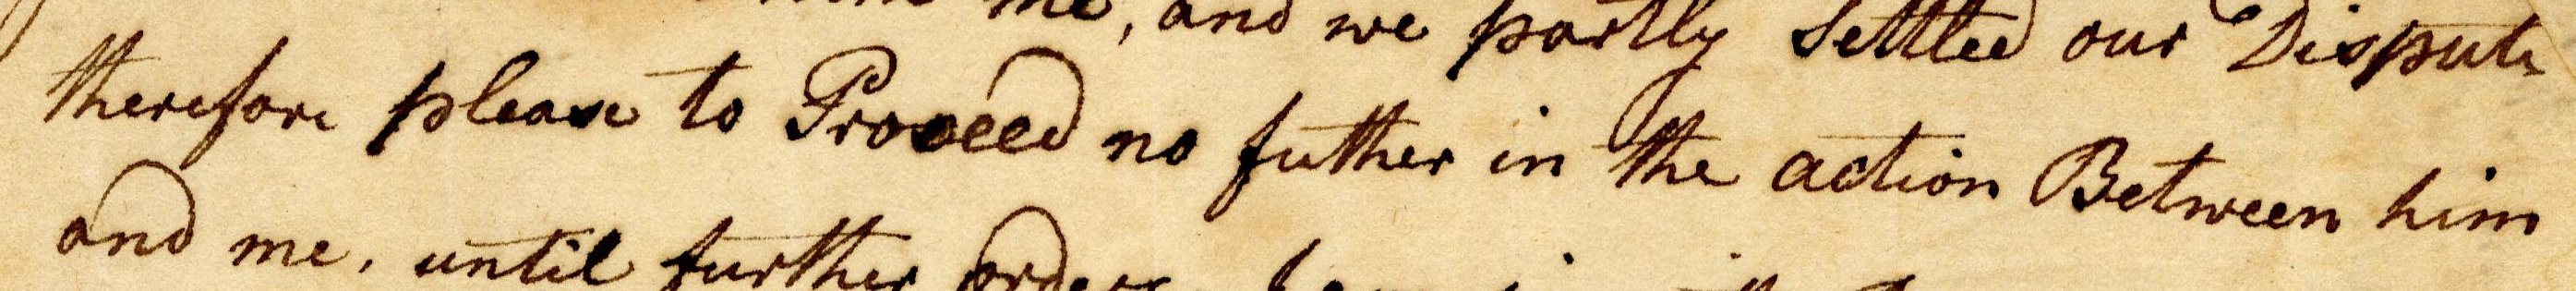therefore please to proceed no further in the Action Between him
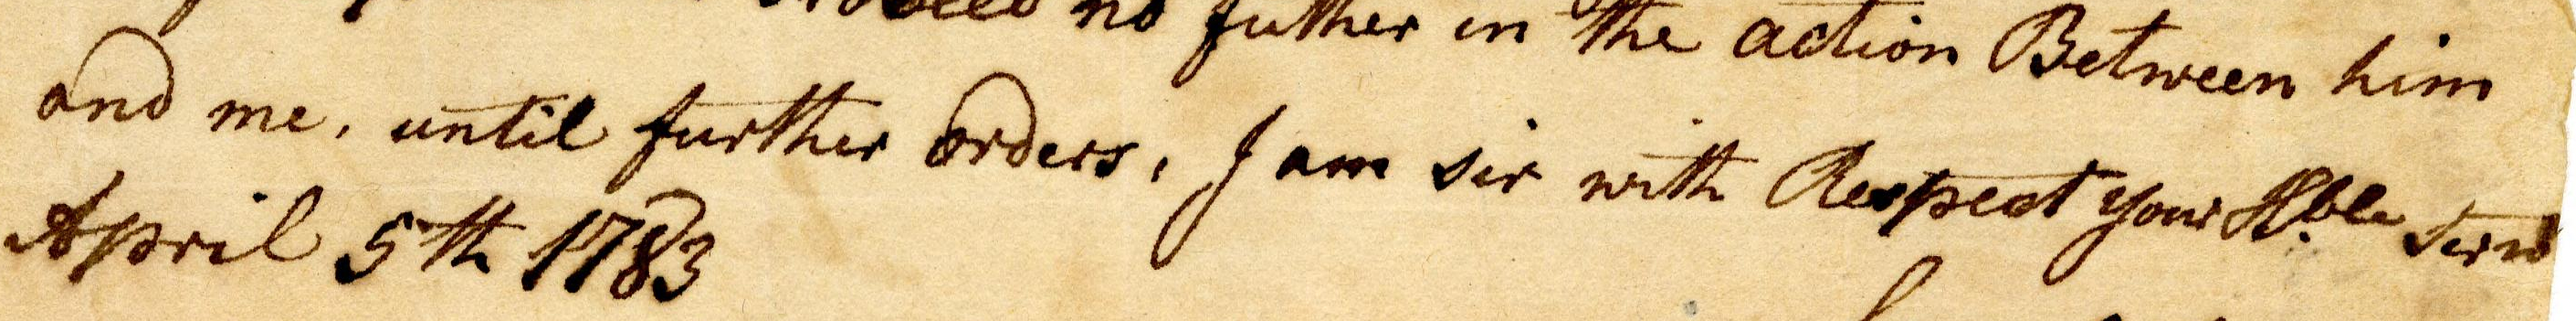and me, until further orders, I am sir with Respect your H^ble. Serv^t
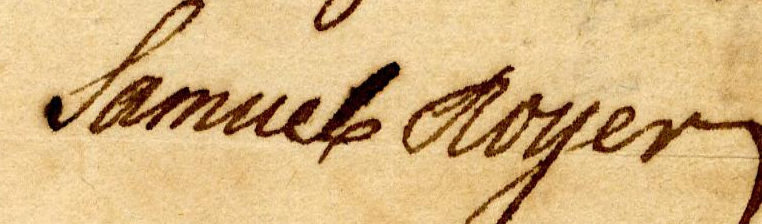Samuel Royer
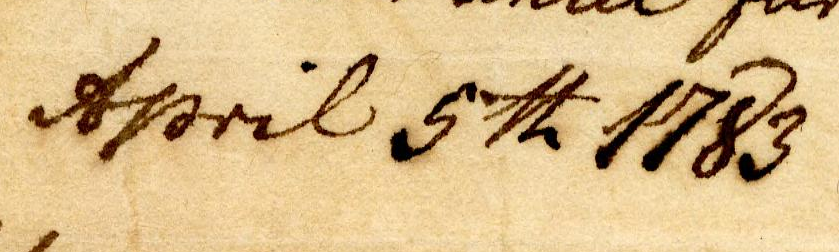April 5th 1783
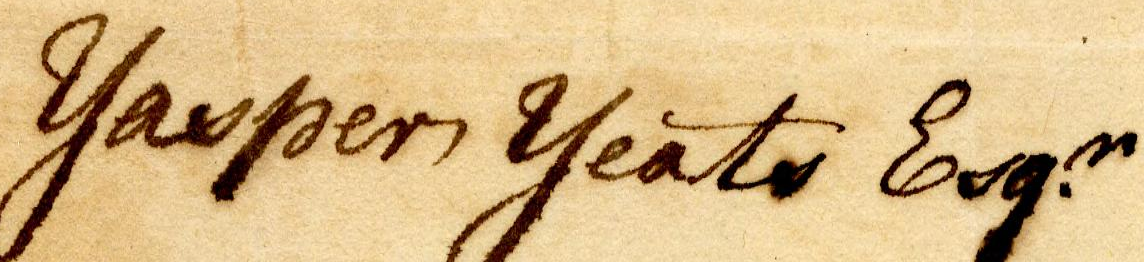Yasper Yeats Esq^r.
